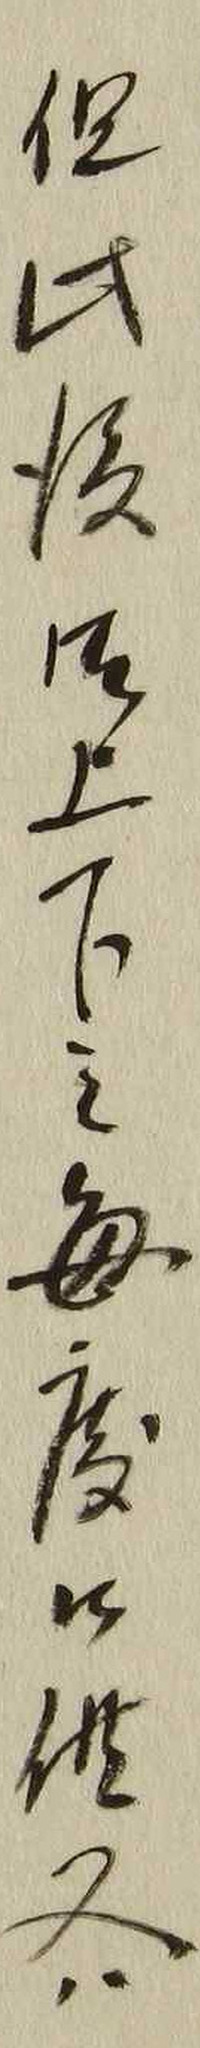但此後御上下之毎度御供又ハ
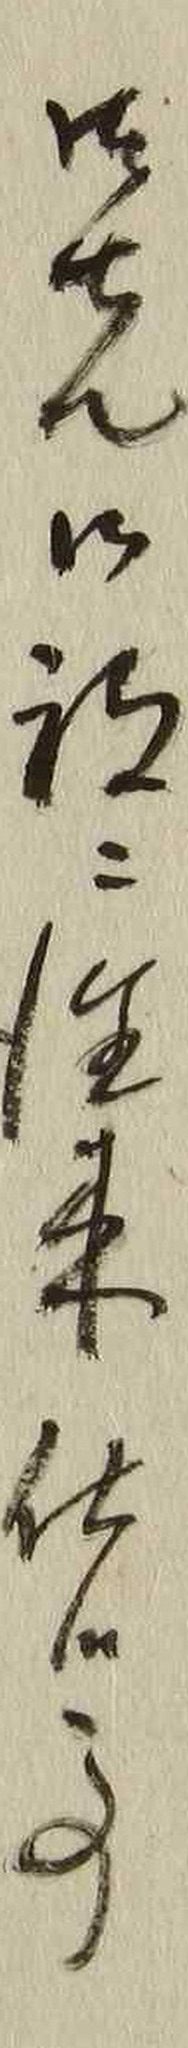御先御跡往来仕候事
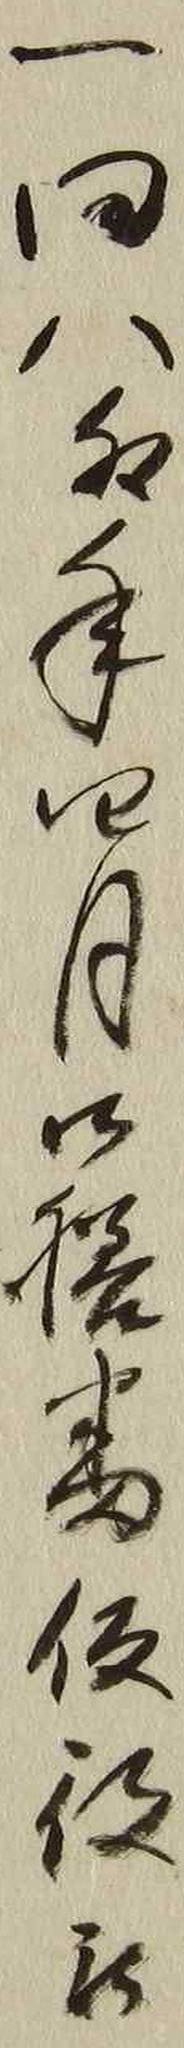一同八卯年四月御膳番仮役被
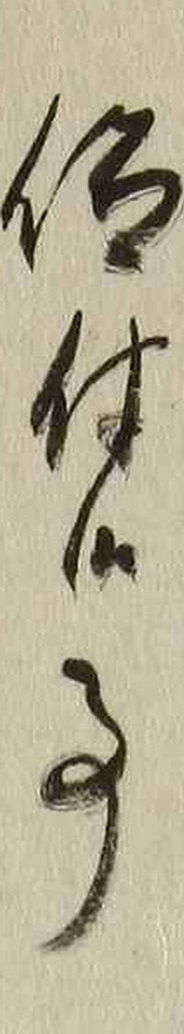仰付候事
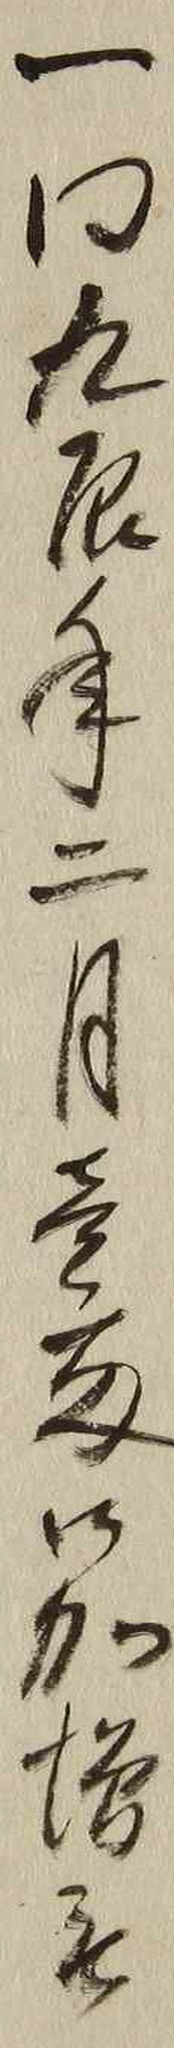一同九辰年二月壱両御加増被
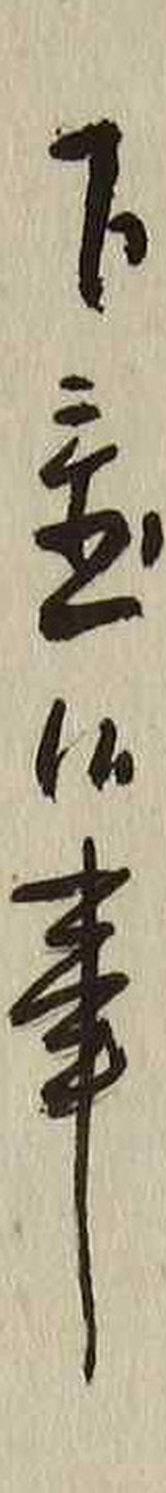下置候事
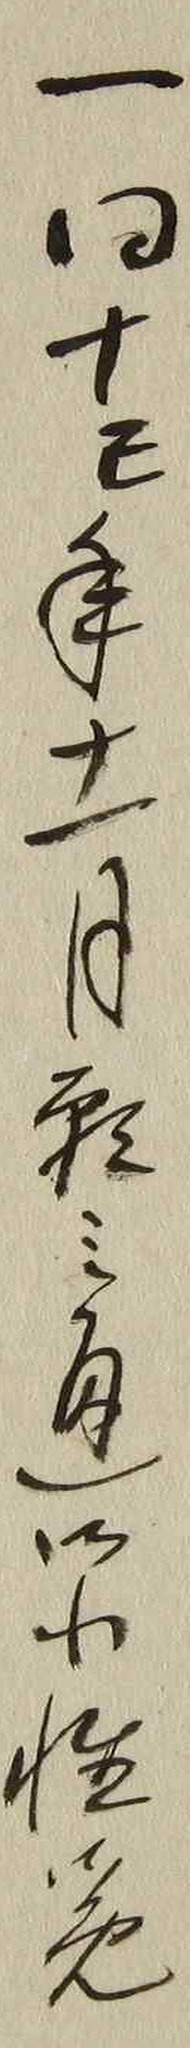一同十巳年十一月願之通御小性御免
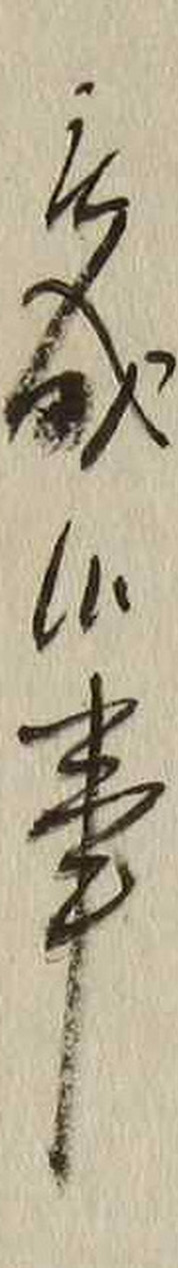被成候事
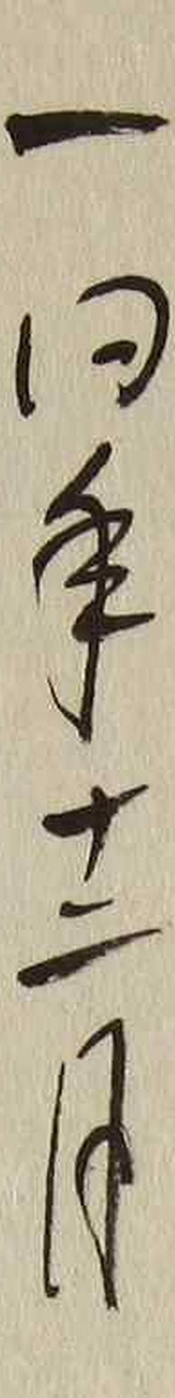一同年十二月
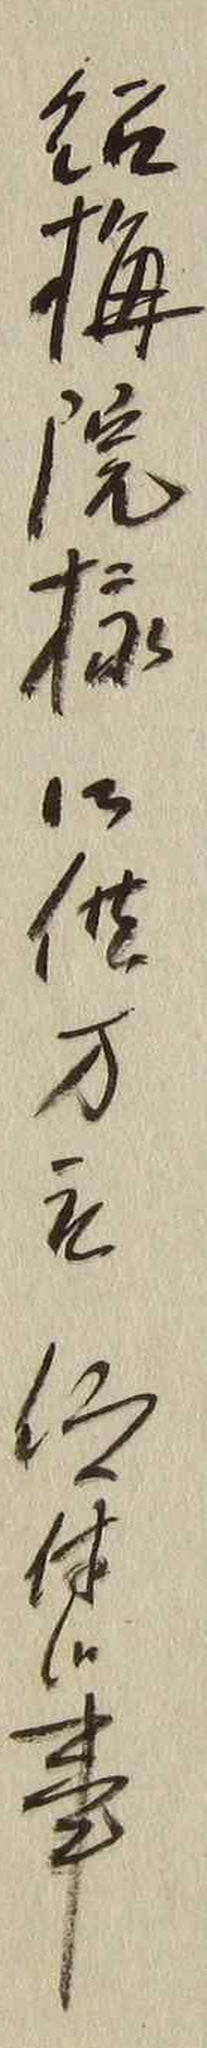紹栴院様御供方被仰付候事
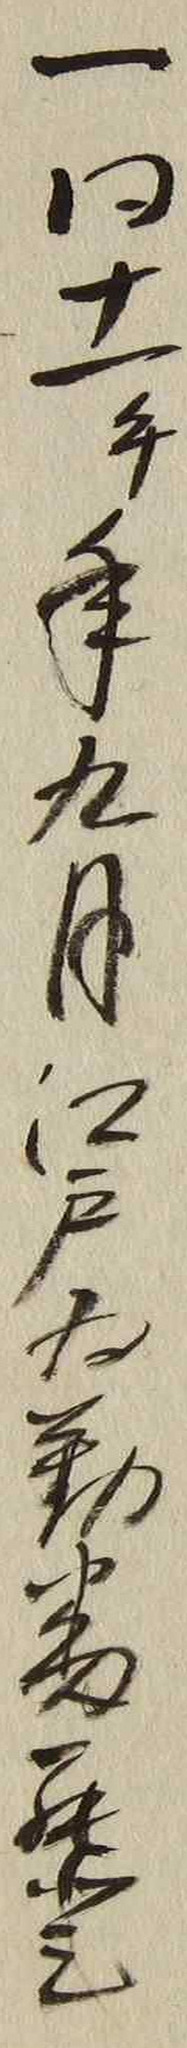一同十一午年九月江戸為勤番罷登
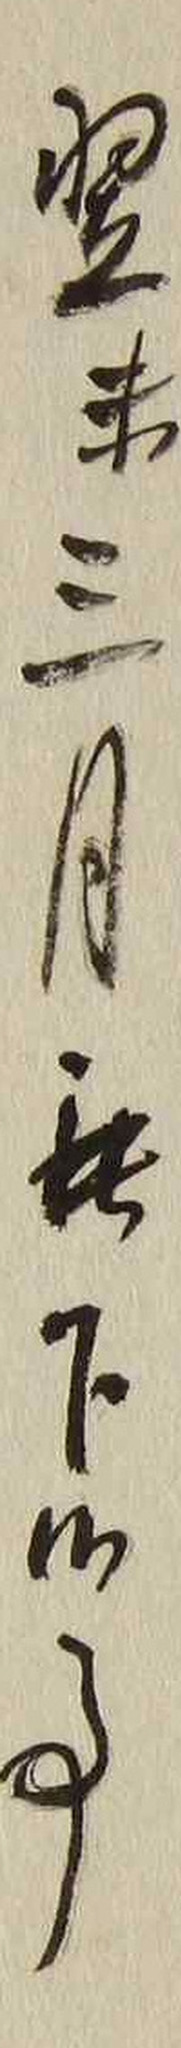翌未三月罷下候事
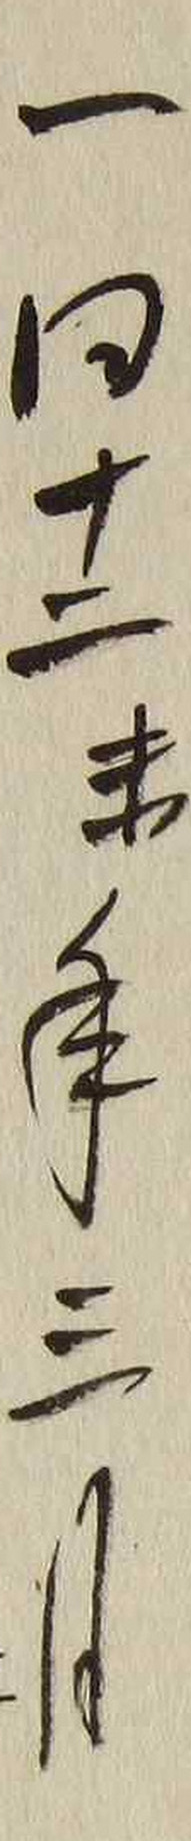一同十二未年三月
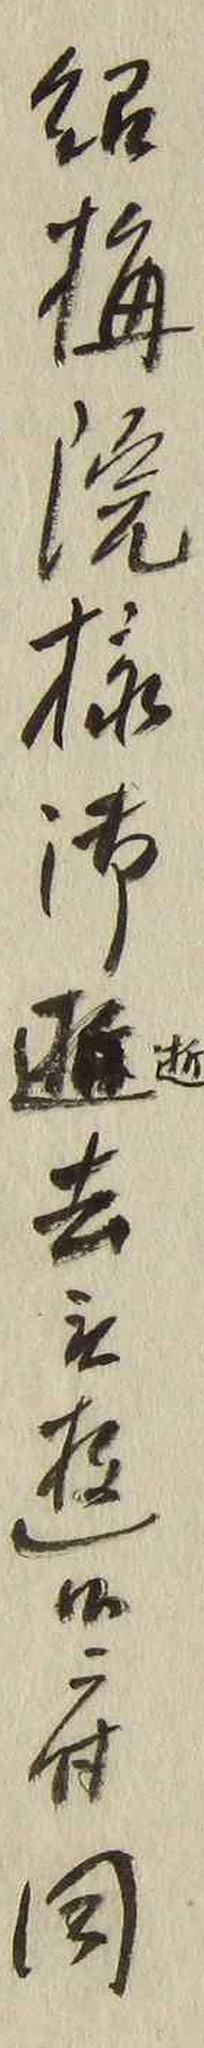紹栴院様御逝去被遊候ニ付同
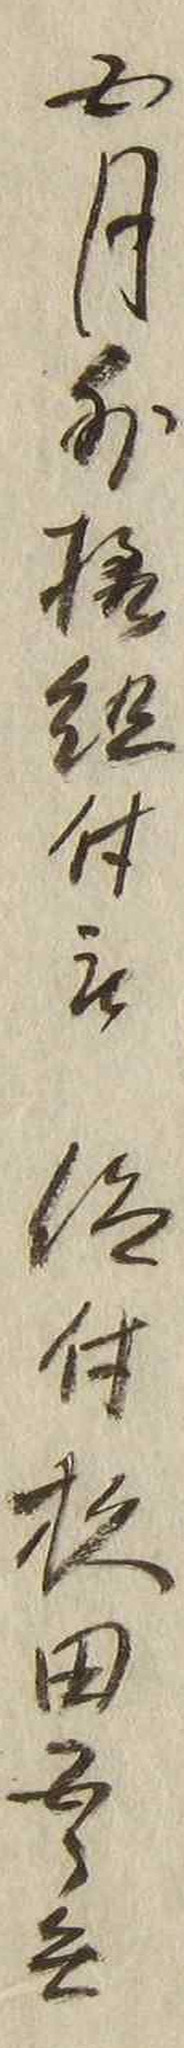五月外様組付被仰付杉田五郎兵

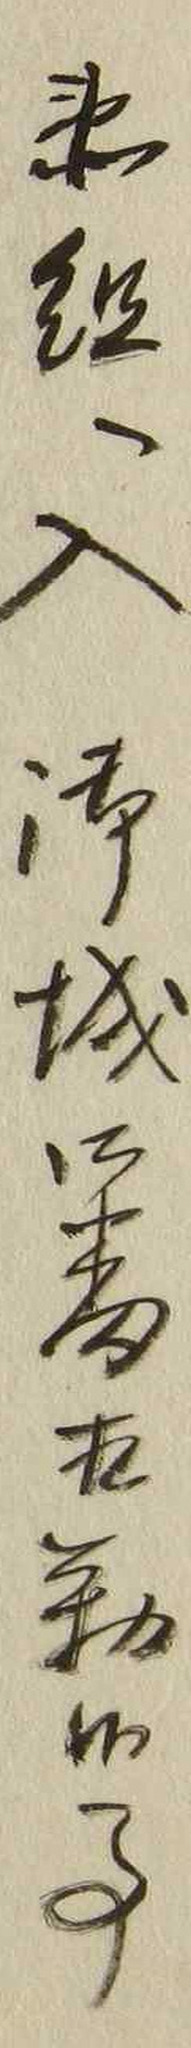衛組へ入御城御番相勤候事
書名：諸士系譜　巻之359　す之部9
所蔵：会津若松市立会津図書館
